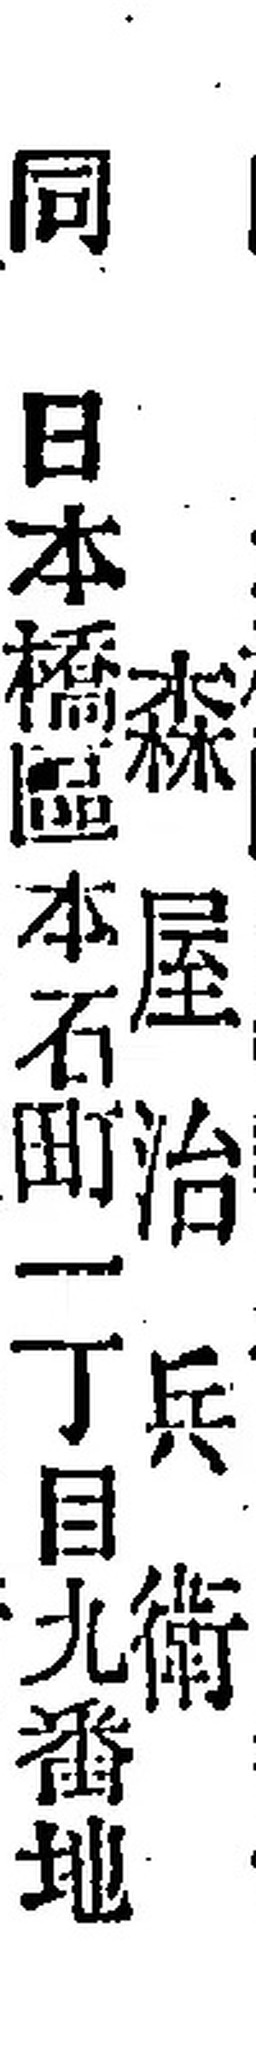同同日本橋區本石町一丁目九番地
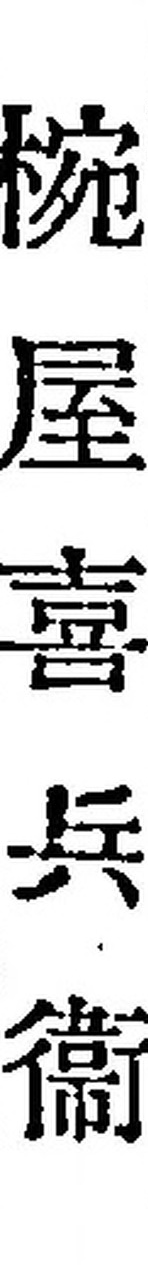椀屋喜兵衛
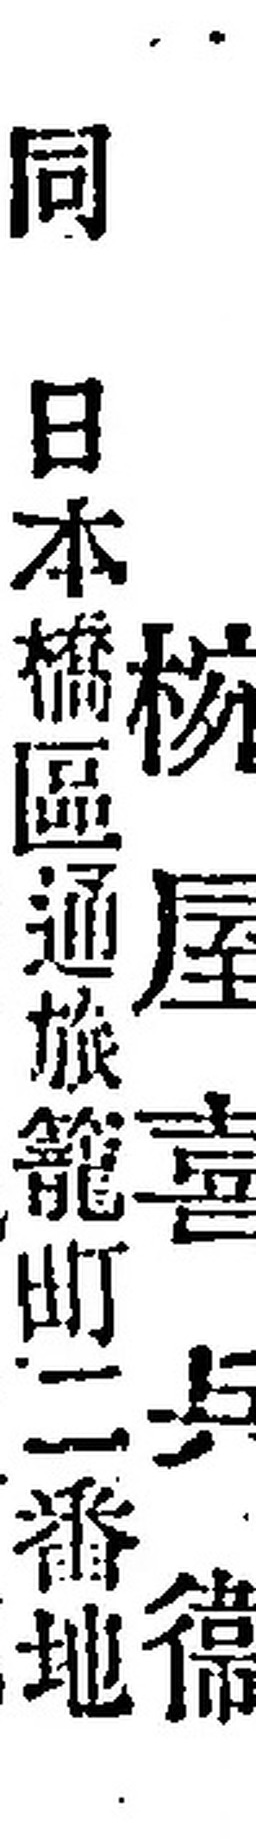同同日本橋區通旅篭町二番地
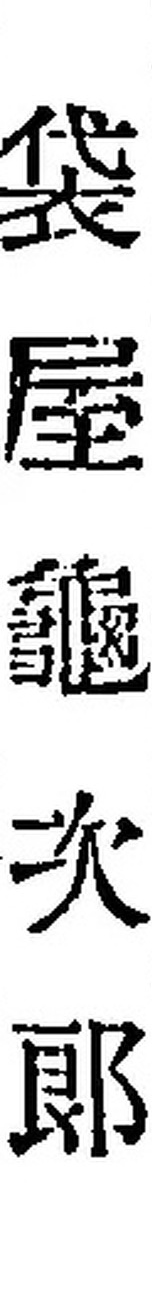袋屋亀次郎
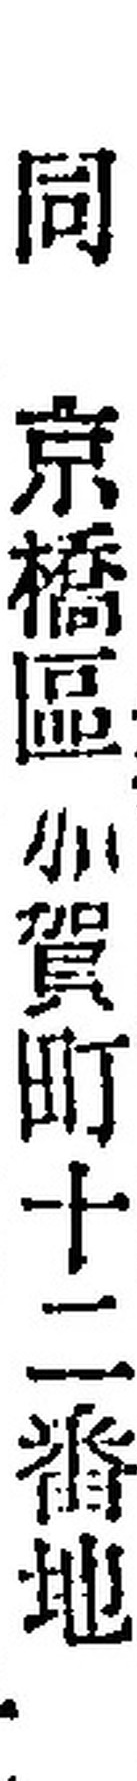同同京橋區加賀町十二番地
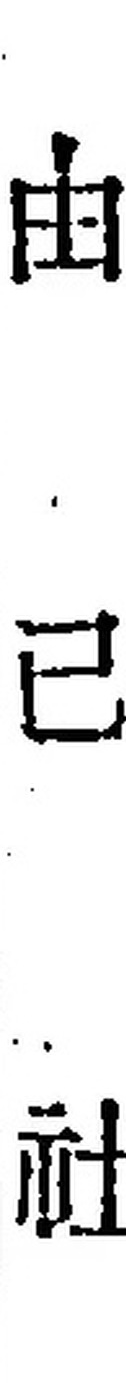由巳社

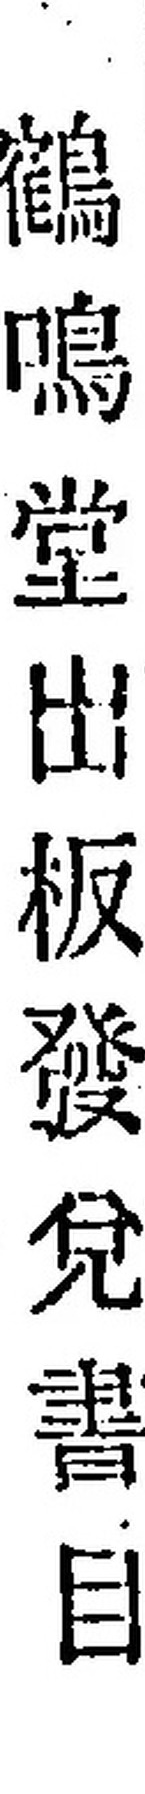鶴鳴堂出版發兌書目
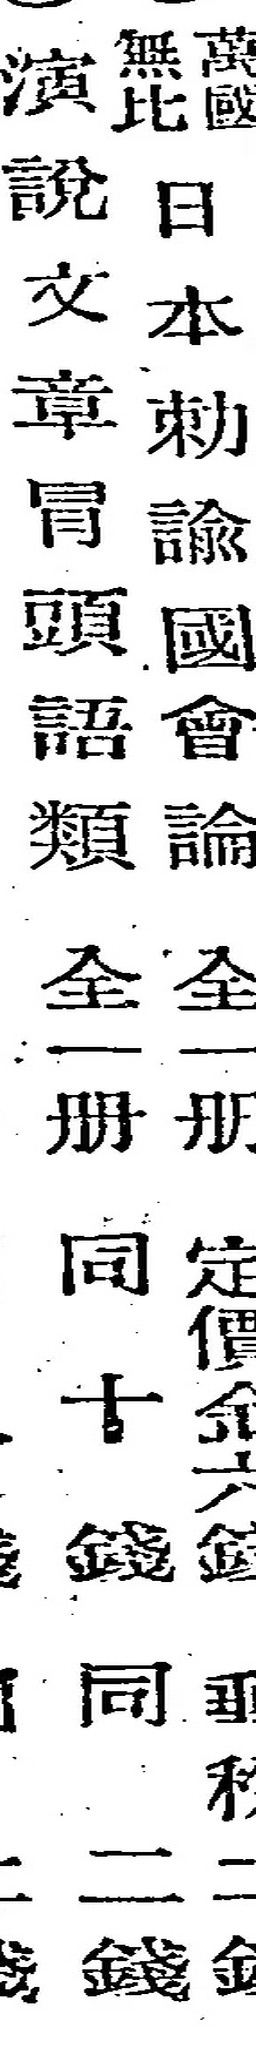〇演説文章冒頭語類全一冊同十銭同二銭
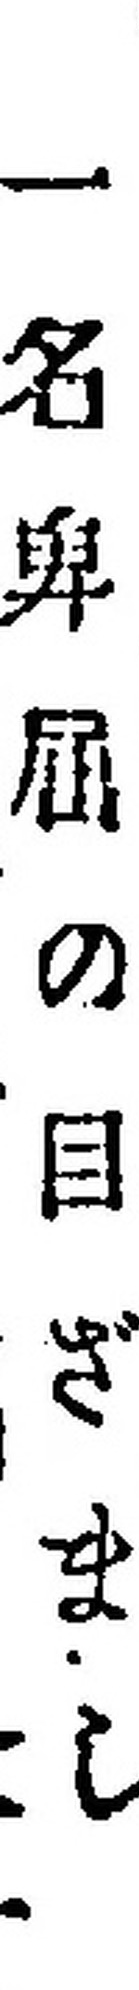一名卑屈の目ざまし
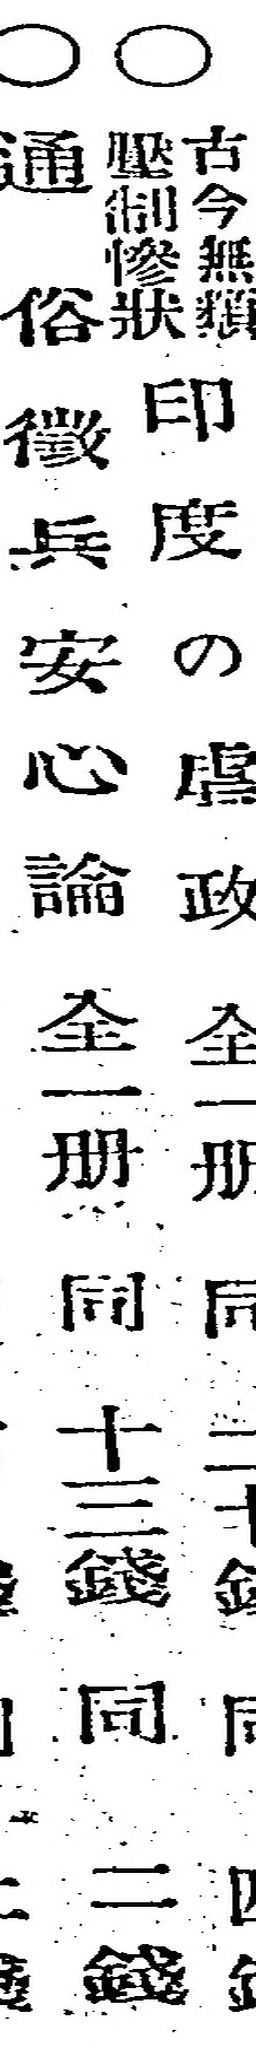〇通俗徴兵安心論全一冊同十三銭同二銭
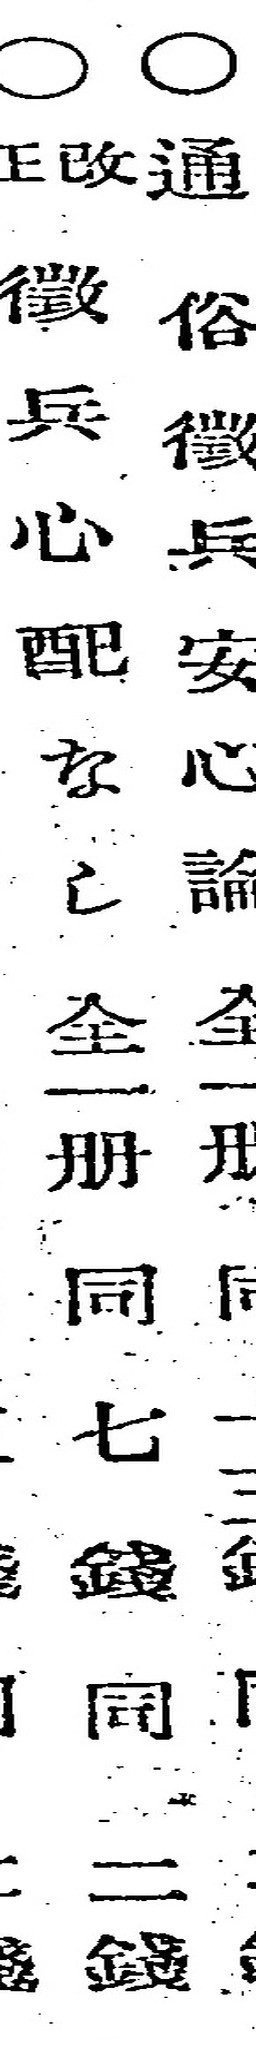〇改正徴兵心配なし全一冊同七銭同二銭
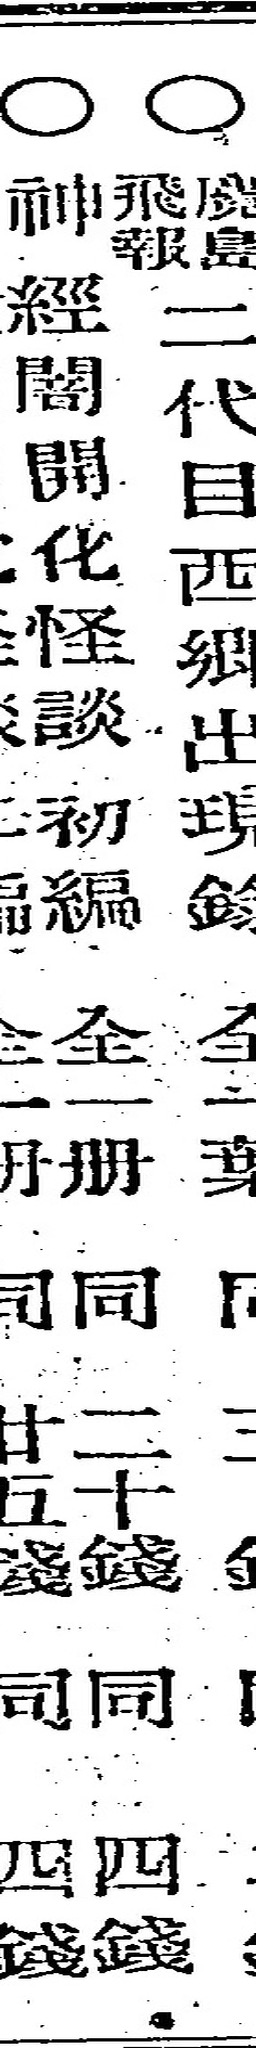〇神経闇開化怪談初編全一冊同二十銭同四銭
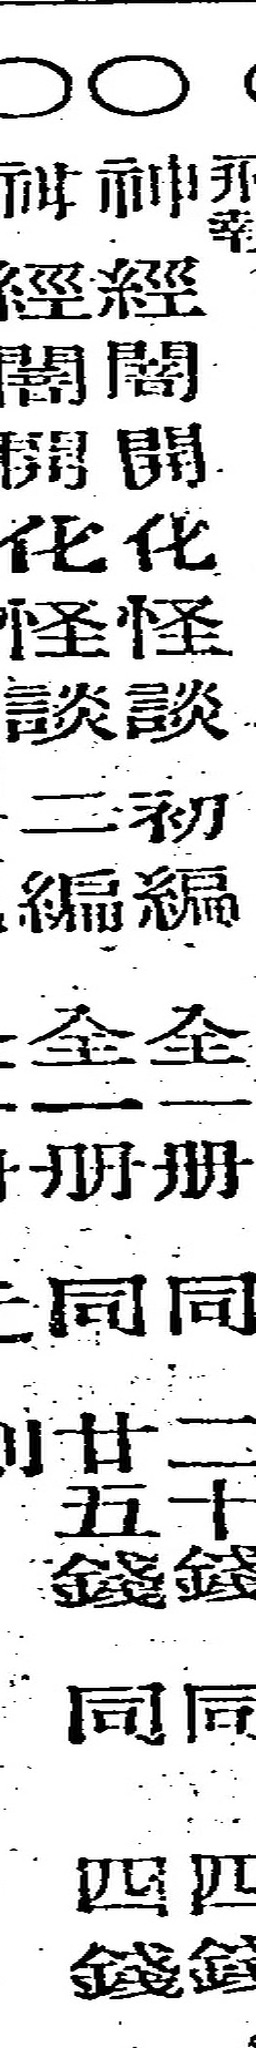〇神経闇開化怪談二編全一冊同廿五銭同四銭
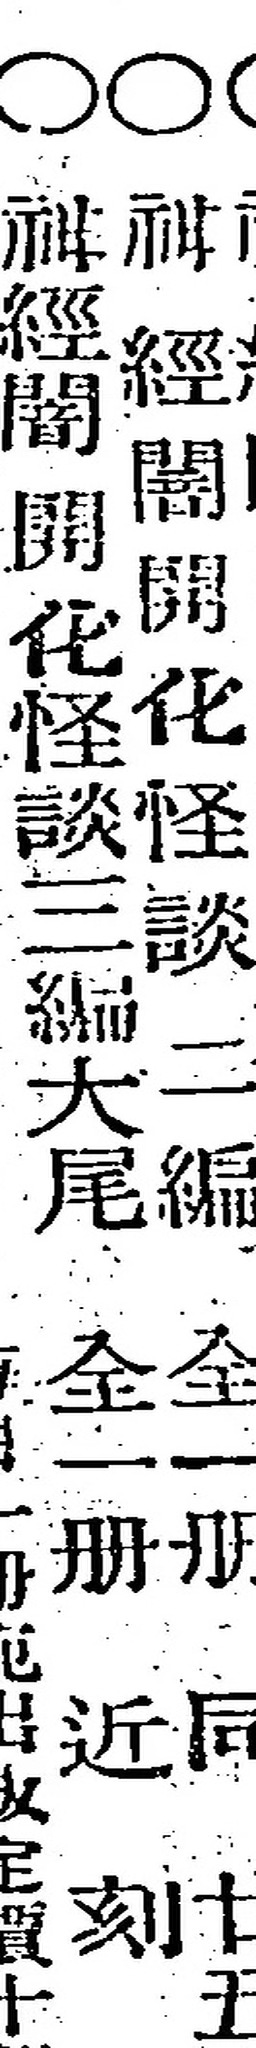〇神経闇開化怪談三編大尾全一冊近刻

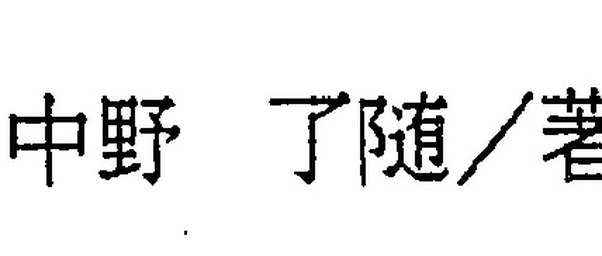中野了随
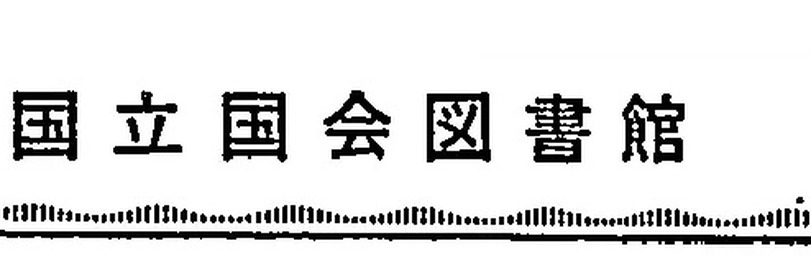国立国会図書館
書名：新撰暑中養生法 : 附・コレラ予防歌
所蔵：国立国会図書館 National Diet Library, JAPAN
